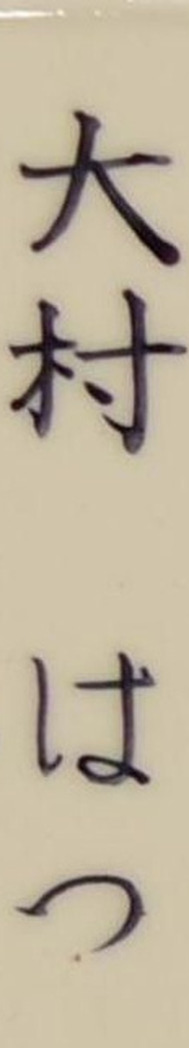大村はつ
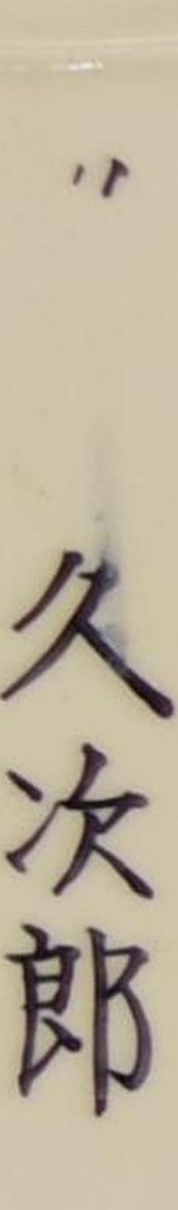久次郎
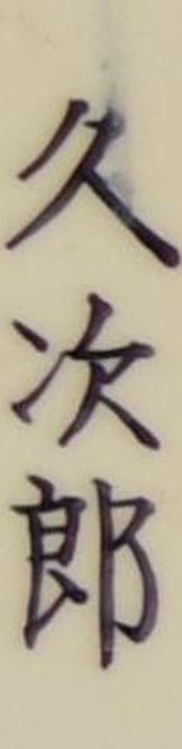久次郎
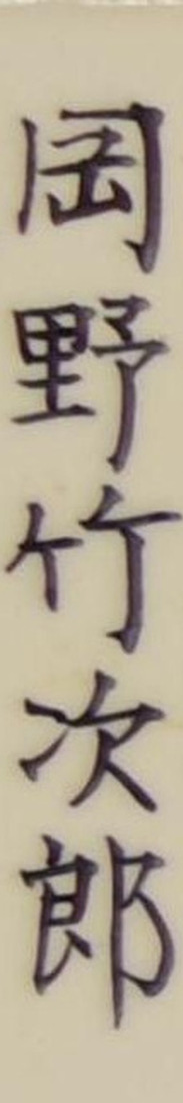岡野竹次郎
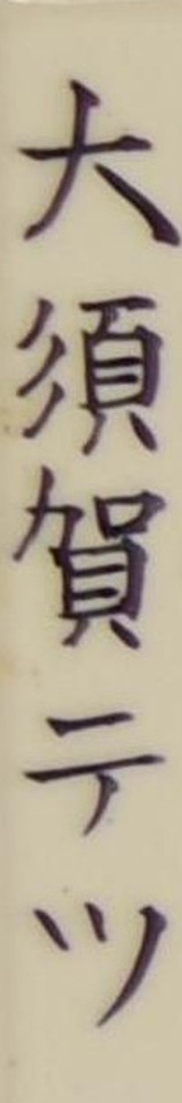大須賀テツ

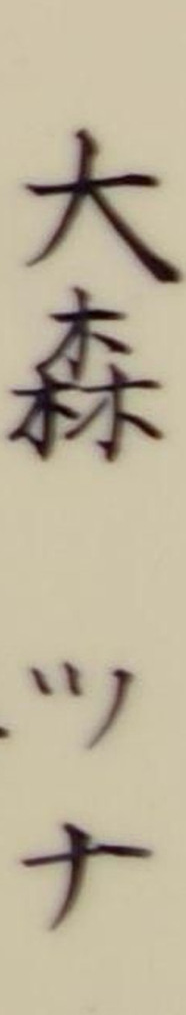大森ツナ
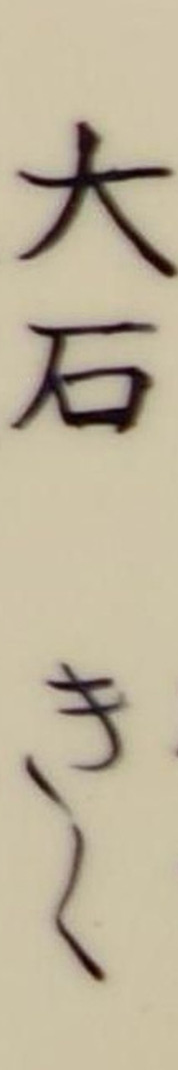大石きく
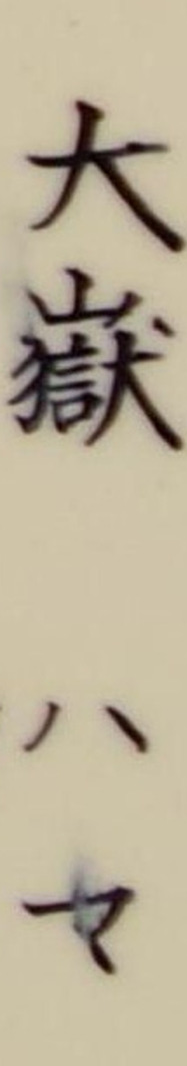大嶽ハマ
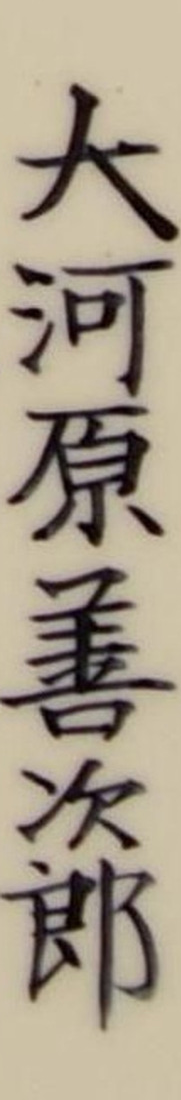大河原善次郎
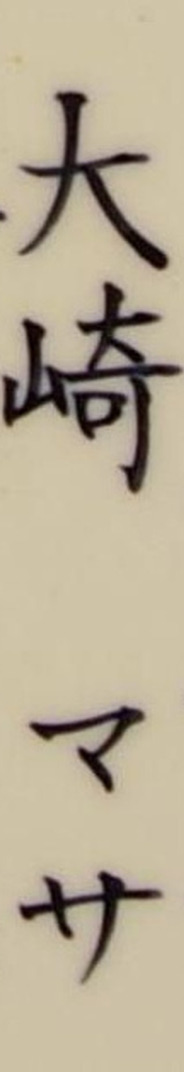大崎マサ
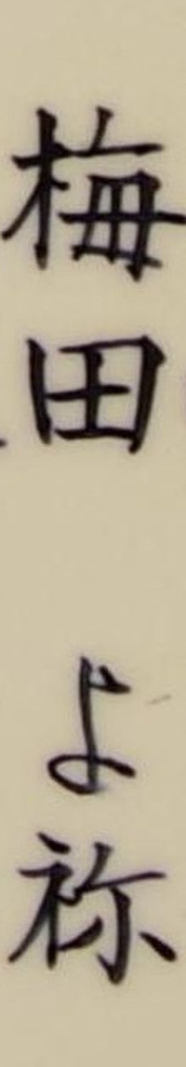梅田よね
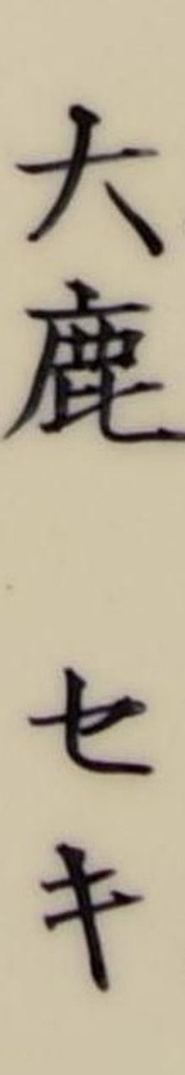大鹿セキ
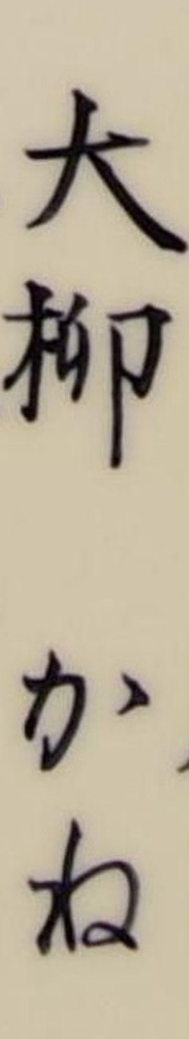大柳かね
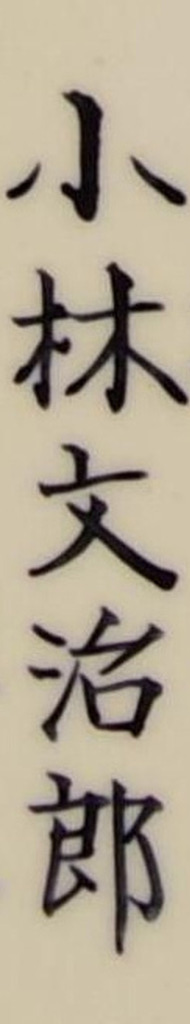小林文治郎
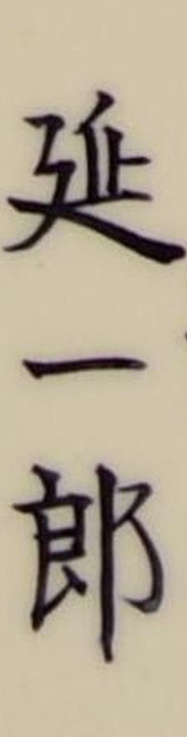延一郎
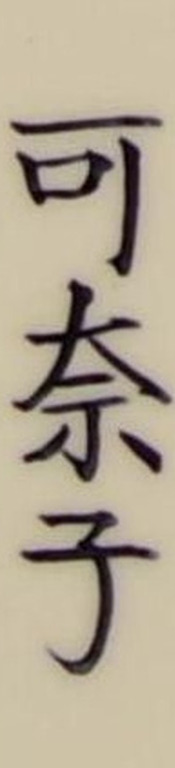可奈子
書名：E~L
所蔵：高野山金剛峯寺
